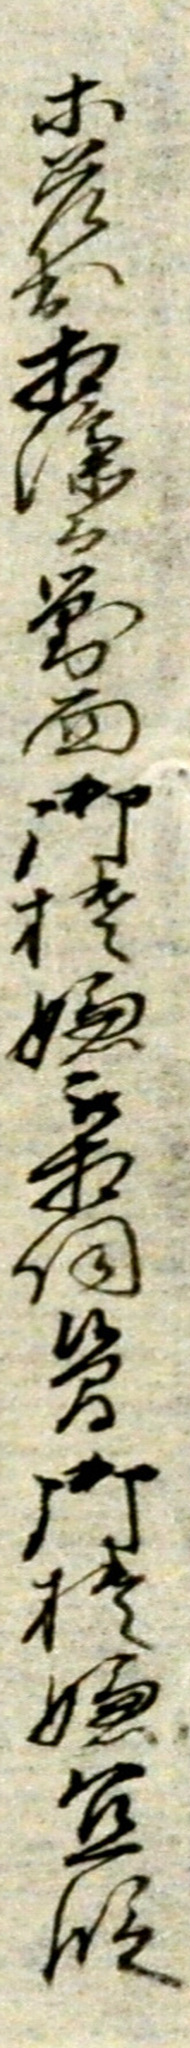等差出相済而対面御機嫌被相伺候間御機嫌宜段
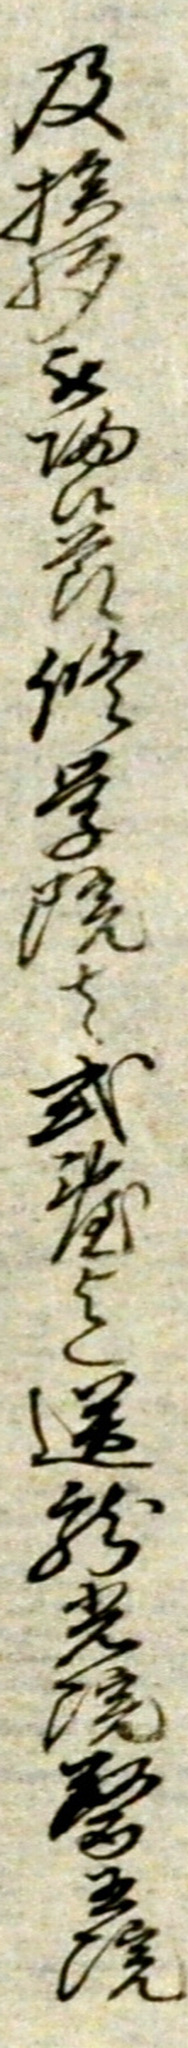及挨拶被帰候節修学院者式台迄送龍光院医王院
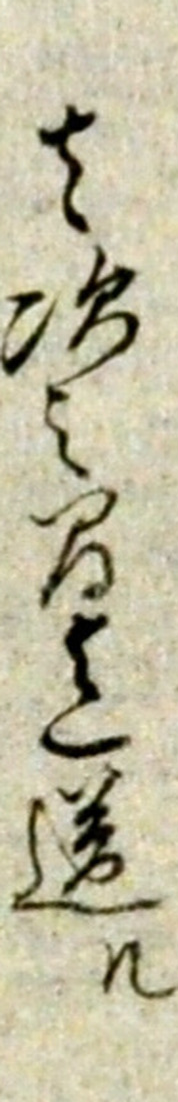者次之間迄送ル
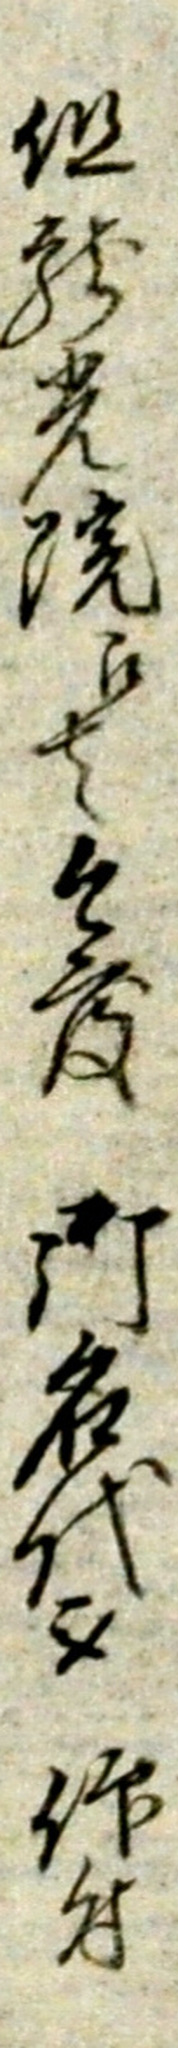但龍光院江者今度御名代被仰付
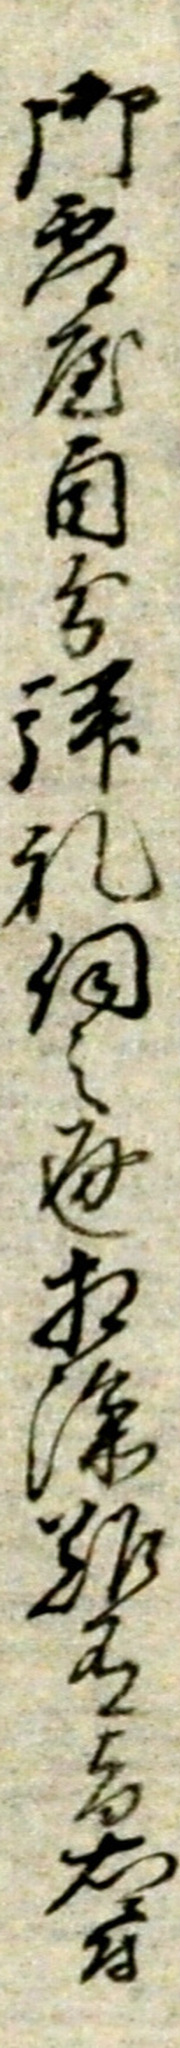御霊屋自分拝礼伺之通相済難有旨右ニ付
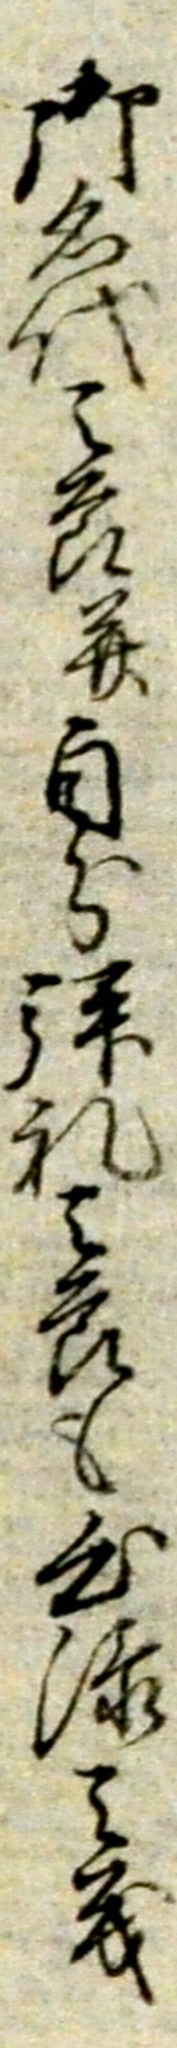御名代之節幷自分拝礼之節も心添之義
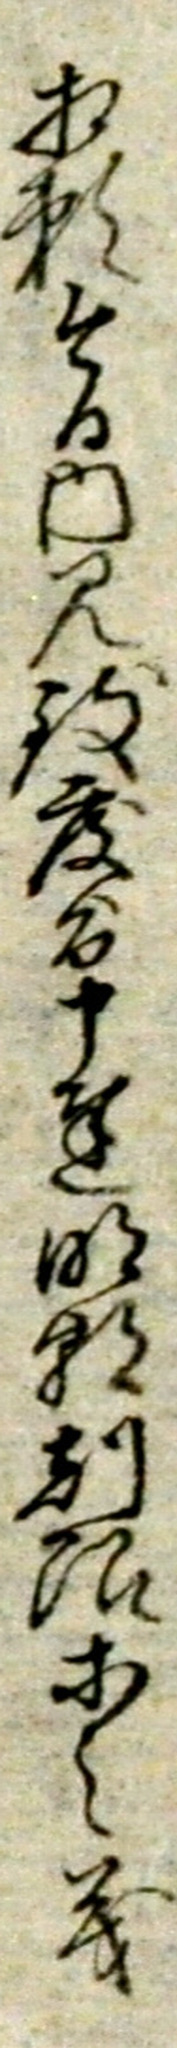相頼今日内見致度旨申達明朝刻限等之義

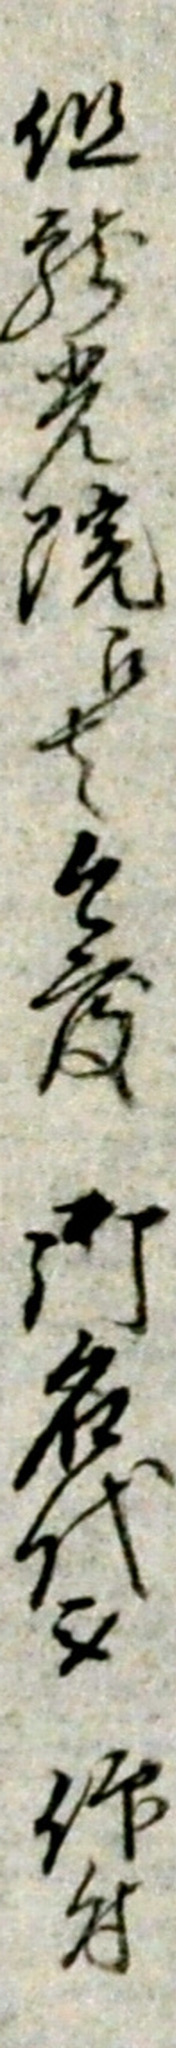但龍光院江者今度御名代被仰付
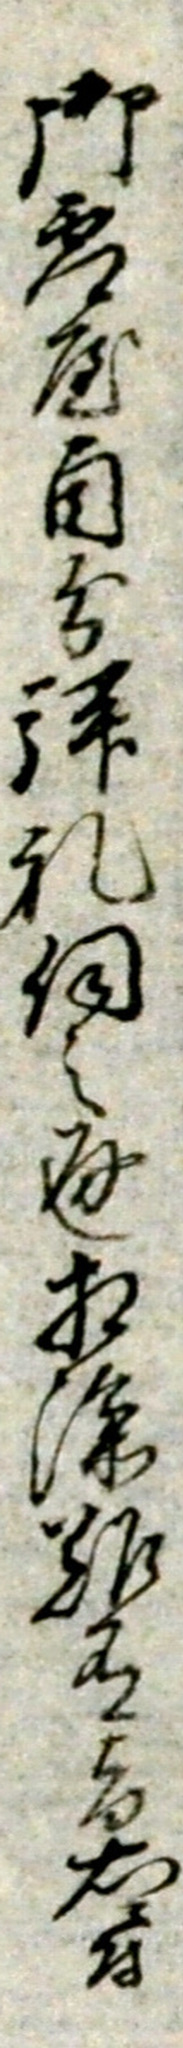御霊屋自分拝礼伺之通相済難有旨右二付
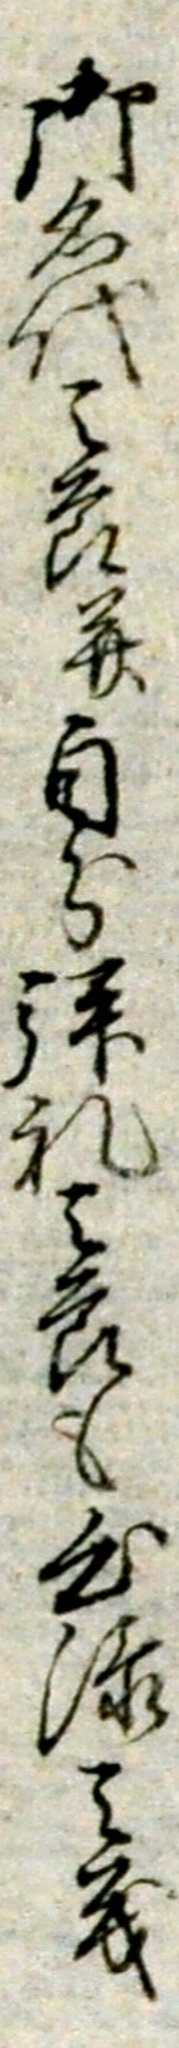御名代之節幷自分拝礼之節も心添之義者
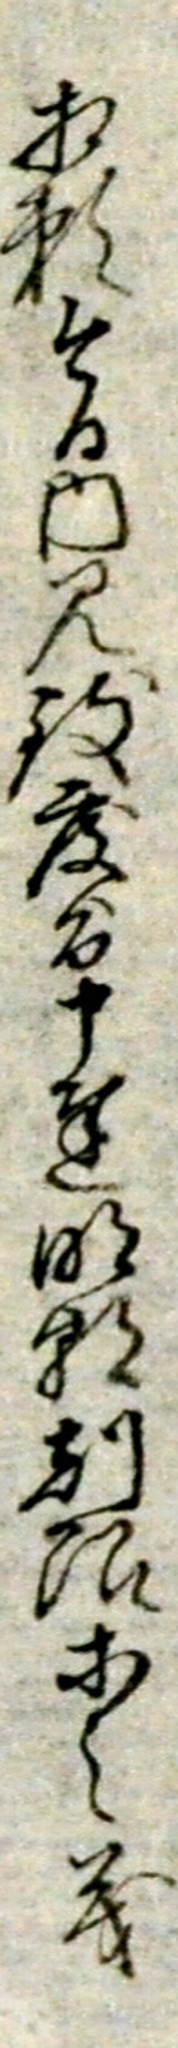相頼今日内見致度旨申達明朝刻限等之義
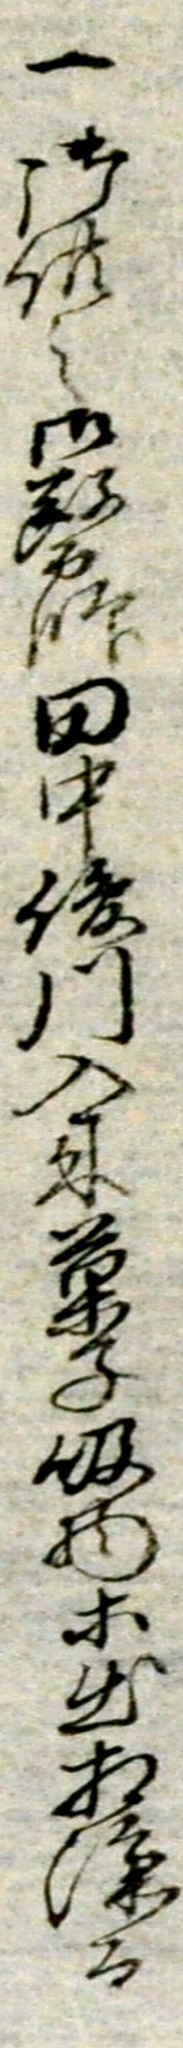一御供之御医師田中俊川入来菓子吸物等出相済而
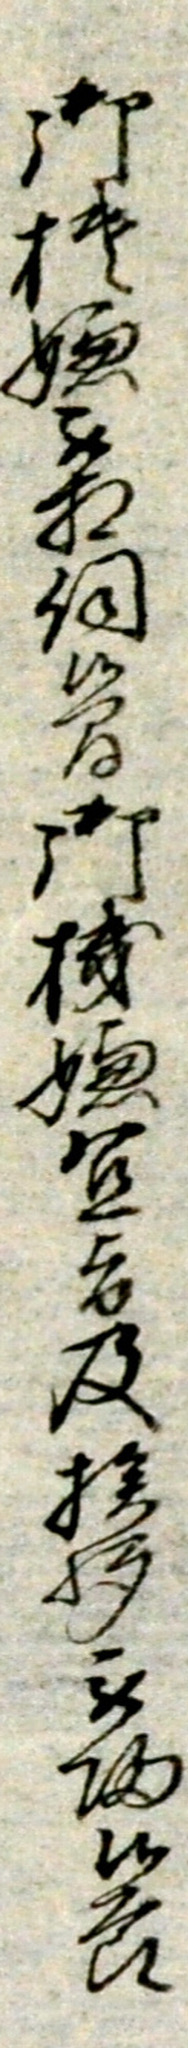御機嫌被相伺候間御機嫌宜旨及挨拶被帰候節
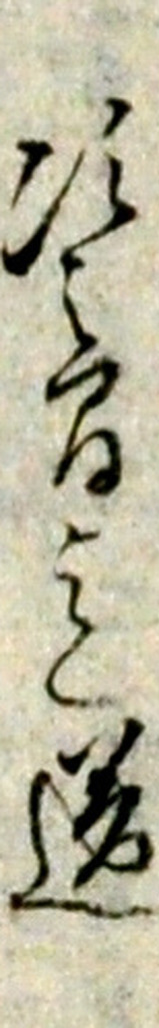次之間迄送
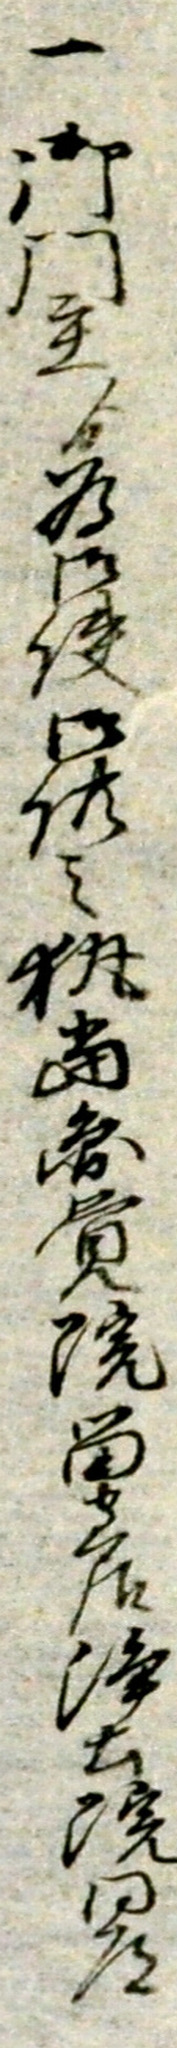一御門主ゟ為御使御供之執当円覚院留守居浄土院同道
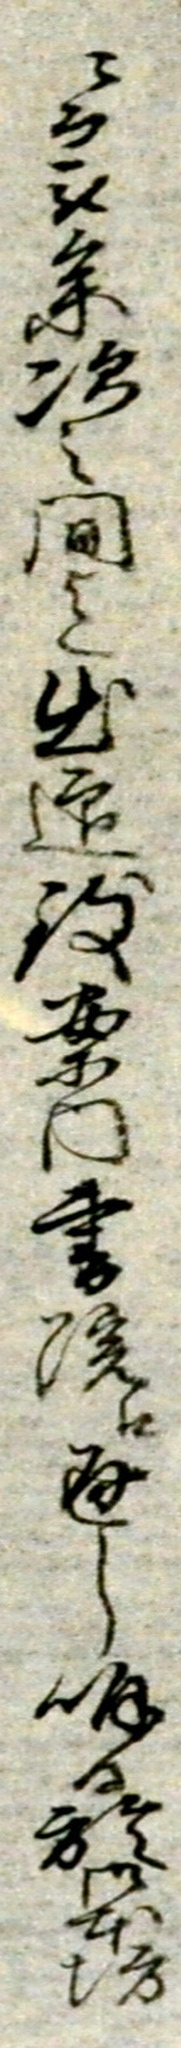ニ而被参次之間迄出迎致案内書院江通し明日於御本坊
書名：日光御名代相勤候節ノ留
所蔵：伊那市立高遠町図書館・合同会社AMANE
